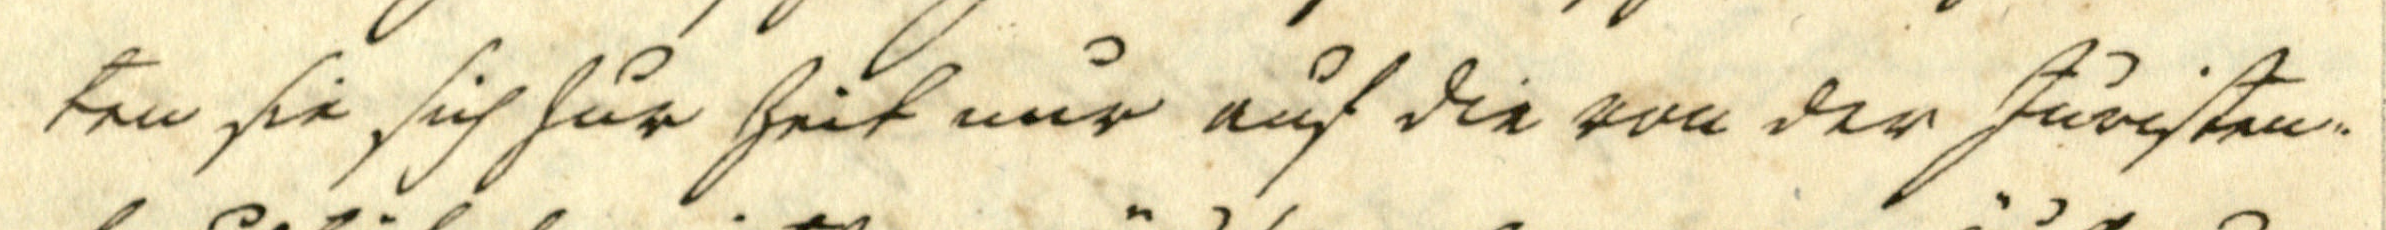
ten sie sich zur Zeit nur auf die von der Juristen¬
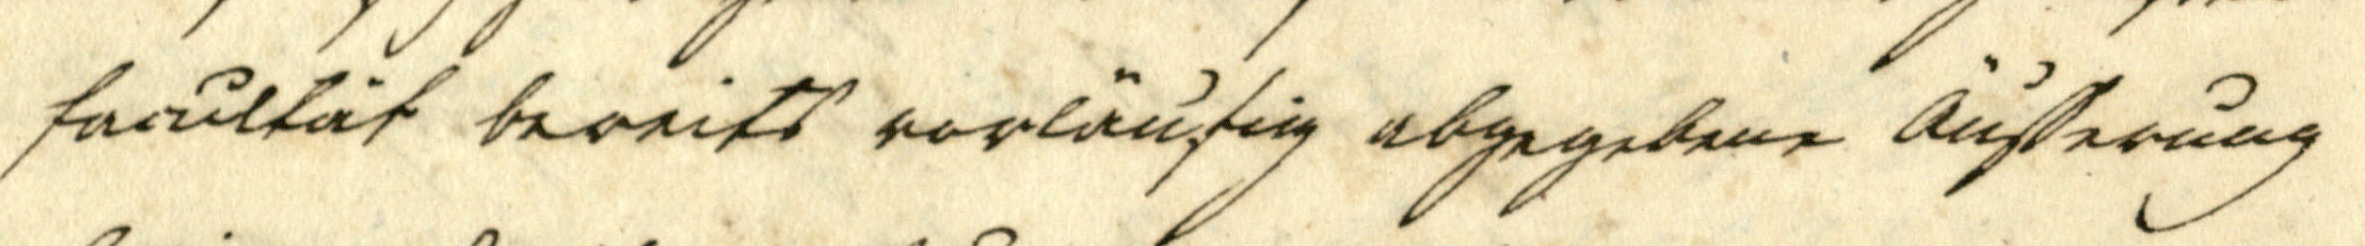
Facultät bereits vorläufig abgegebene Äusserung
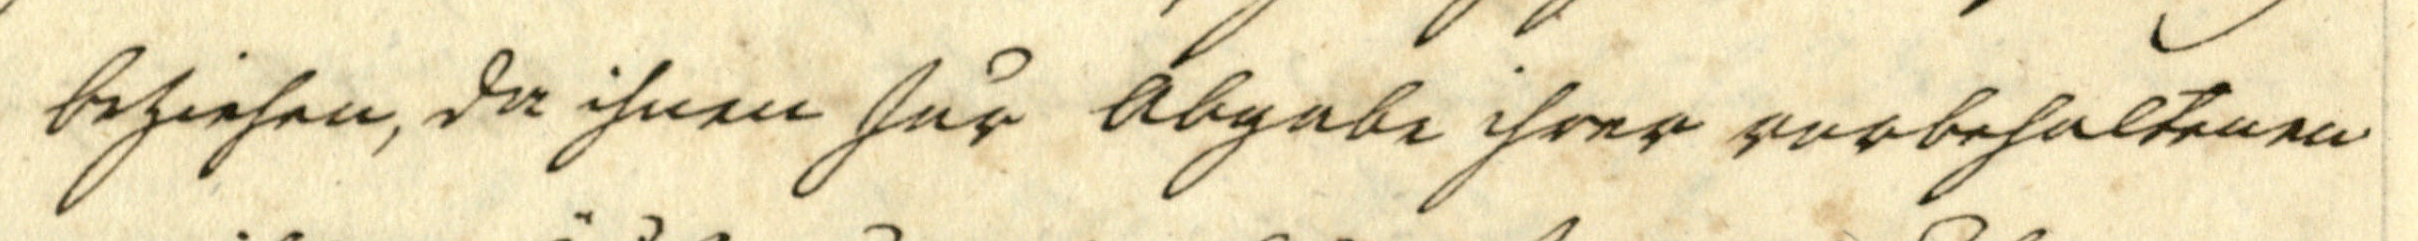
beziehen, da ihnen zur Abgabe ihrer vorbehaltenen
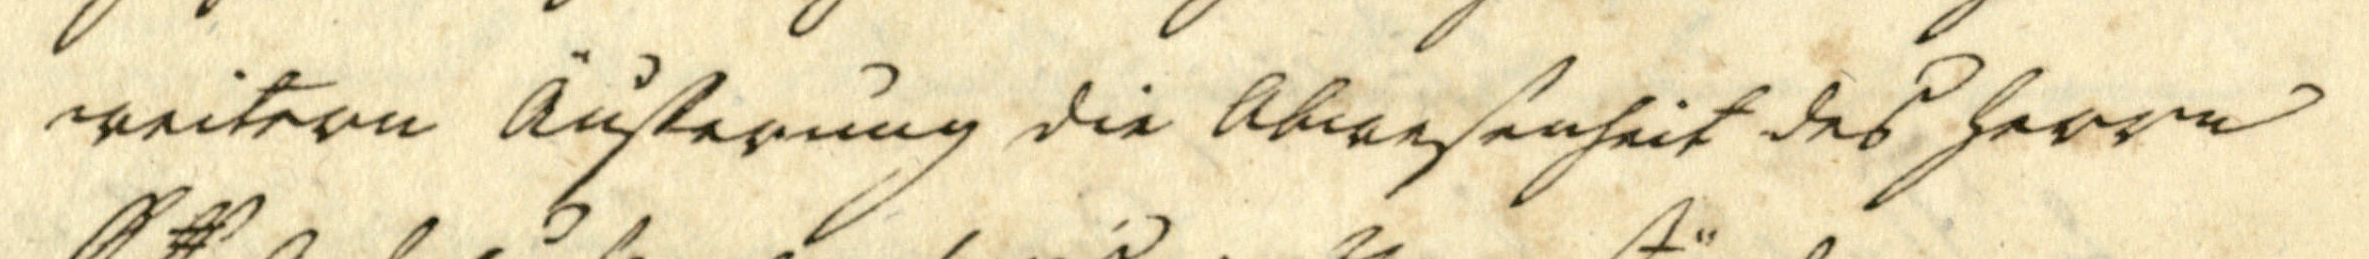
weitern Äusserung die Abwesenheit des Herrn
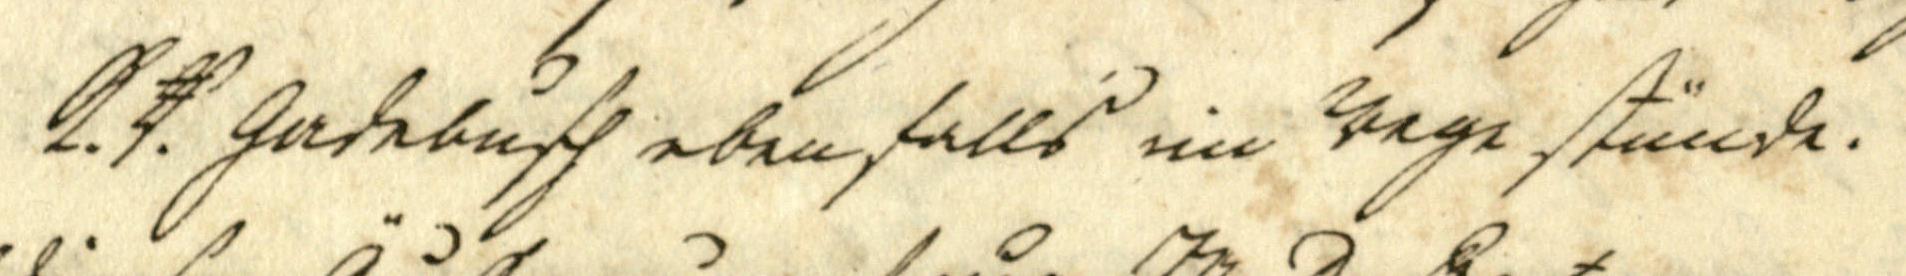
K. R. Gadebusch ebenfalls im Wege stünde.
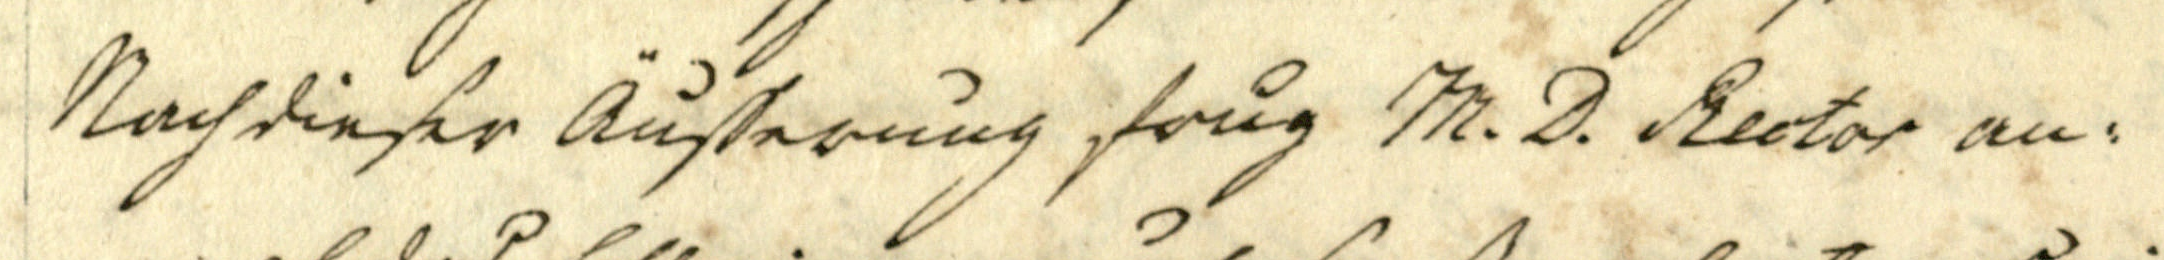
Nach dieser Äusserung frug M. D. Rector an:
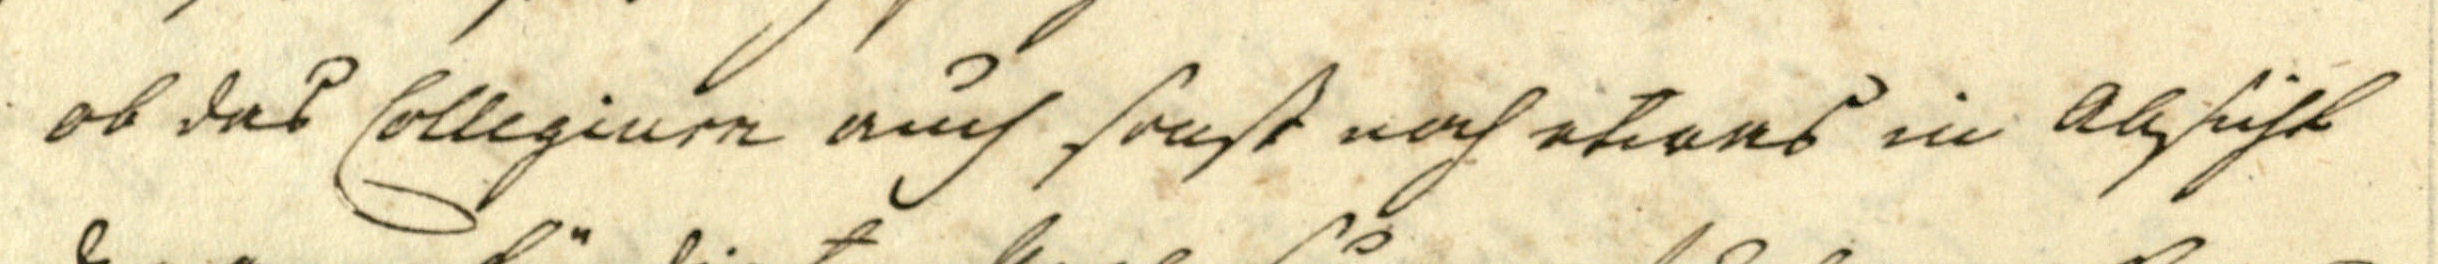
ob das Collegium auch sonst noch etwas in Absicht
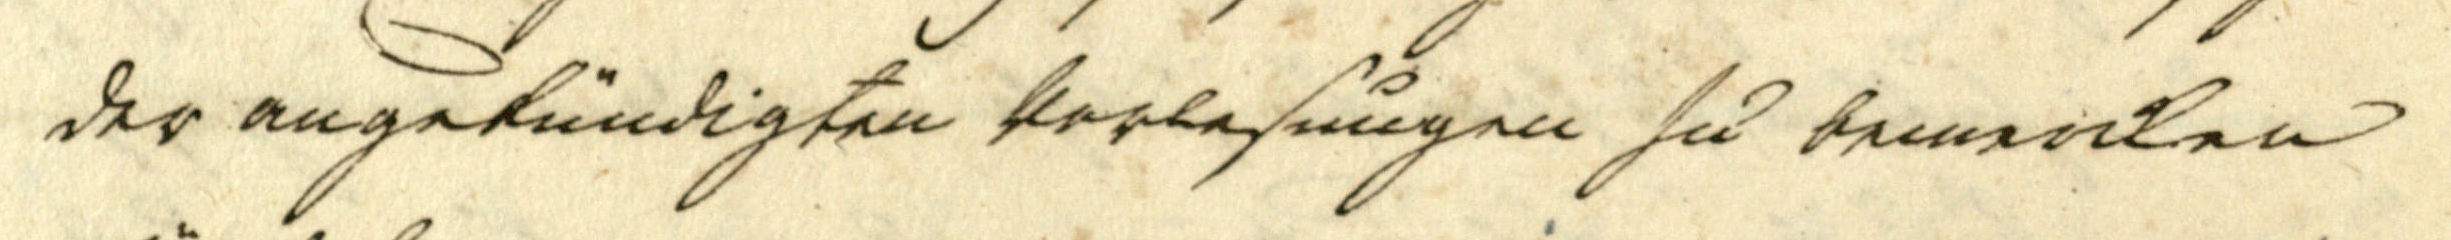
der angekündigten Vorlesungen zu bemercken
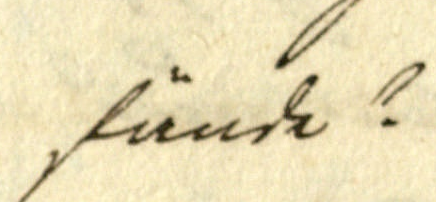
fände?
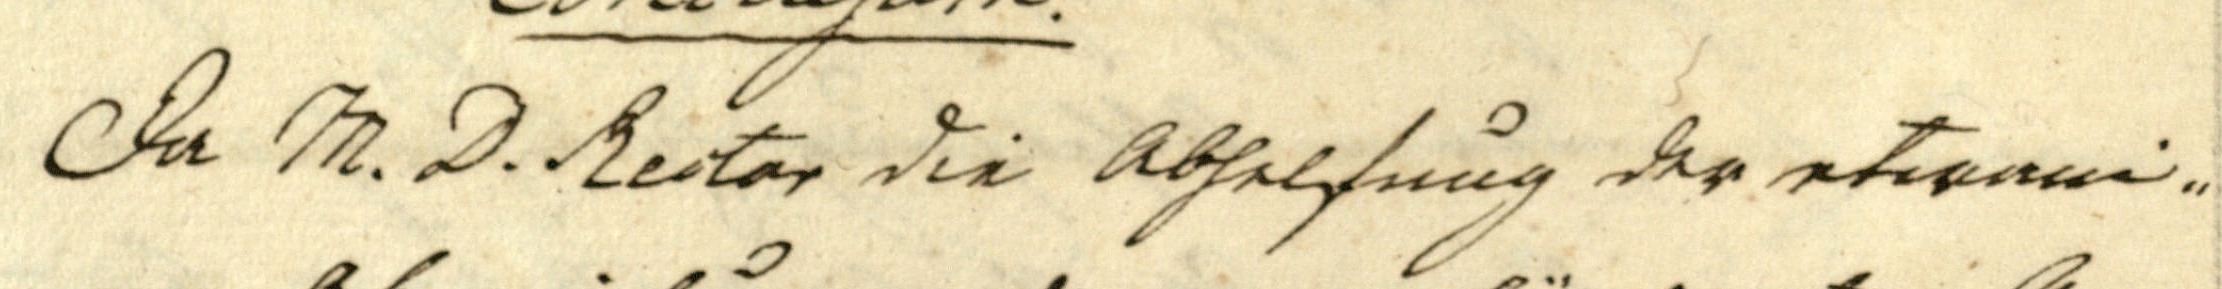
Da M. D. Rector die Abhelfung der etwani¬
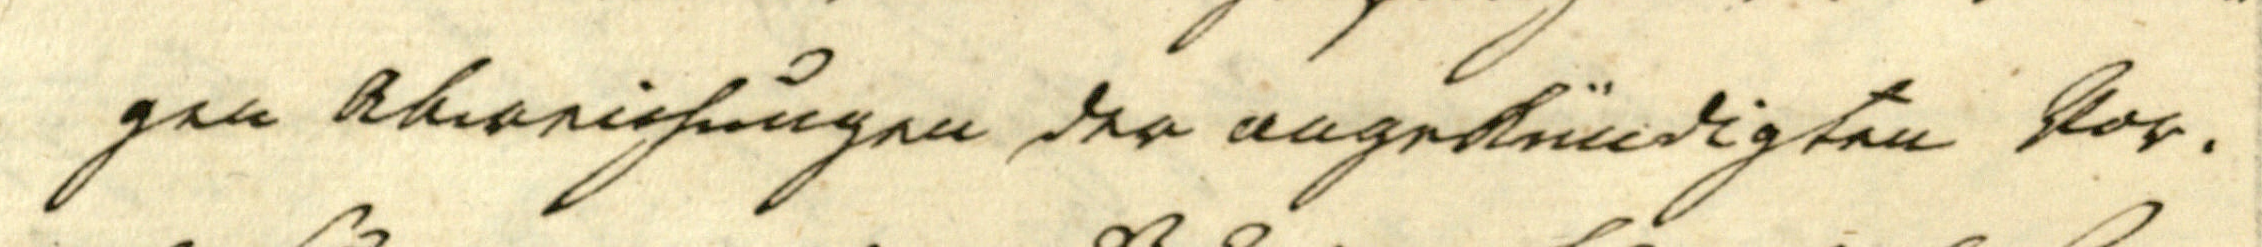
gen Abweichungen der angekündigten Vor¬
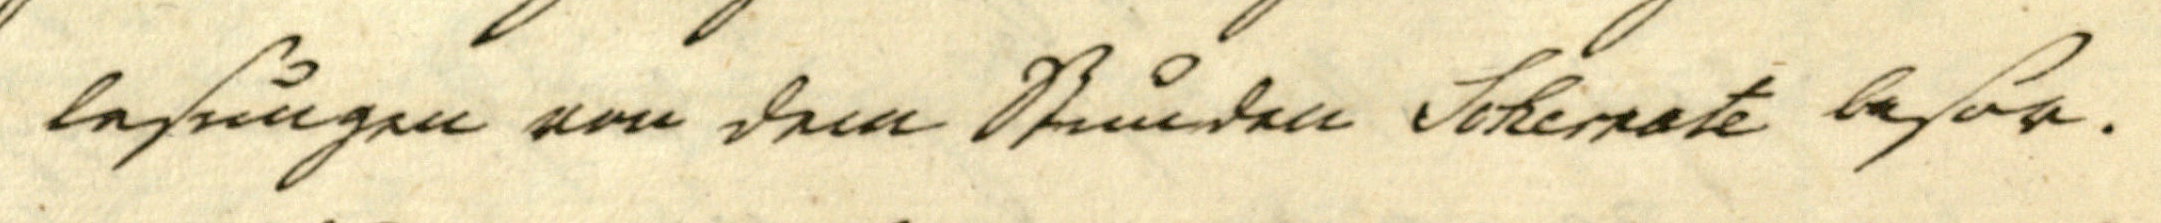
lesungen von dem Stunden Schemate besor¬
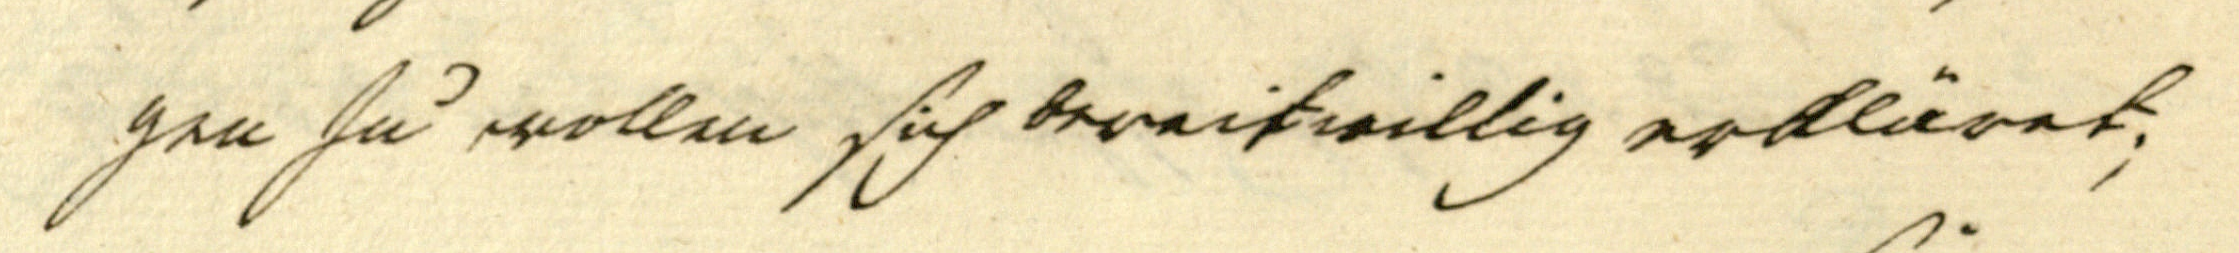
gen zu wollen sich bereitwillig erkläret,
